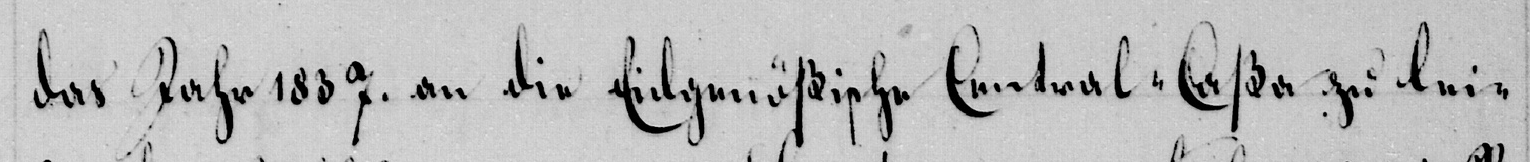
das Jahr 1837. an die Eidgenößische Central-Caßa zu lei¬
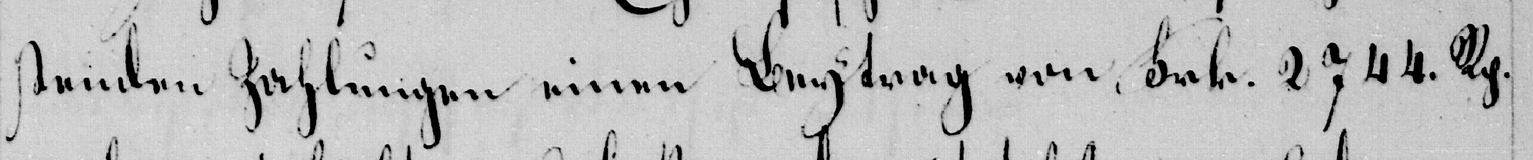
stenden Zahlungen einen Beytrag von Frk. 2744. Rp.
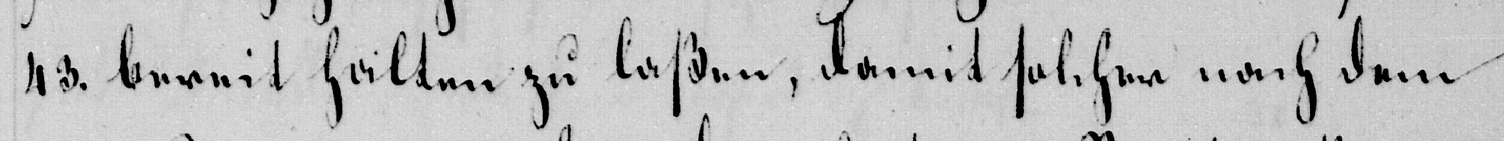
43. bereit halten zu laßen, damit solcher nach dem
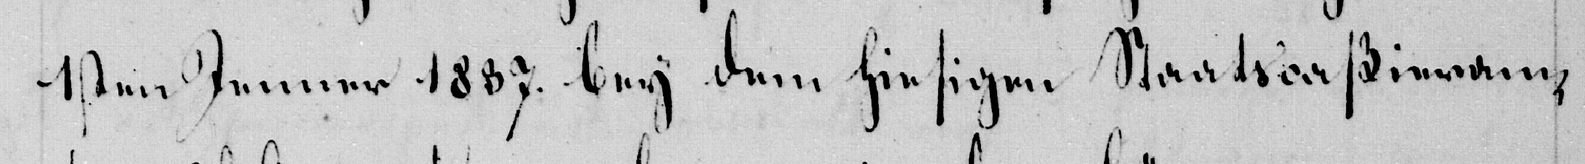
1sten Jenner 1837. bey dem hiesigen Staatscaßieram¬
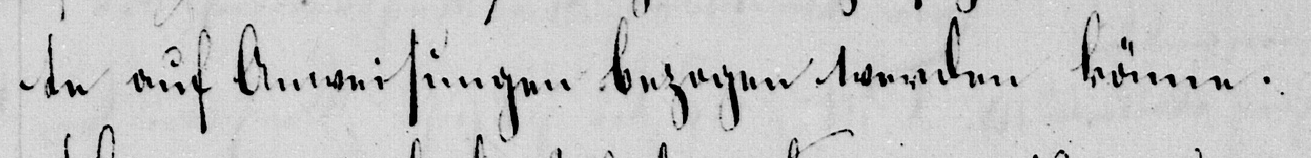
te auf Anweisungen bezogen werden könne.
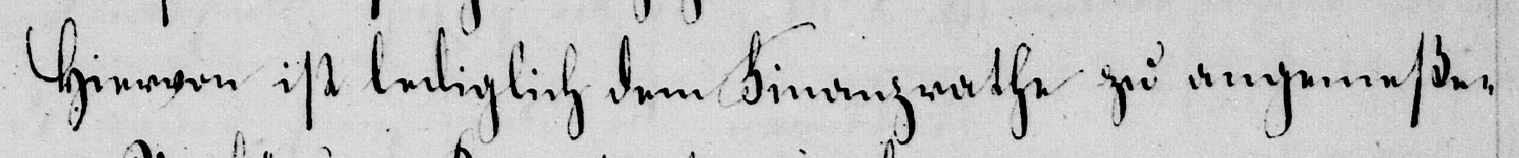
Hiervon ist lediglich dem Finanzrathe zu angemeße¬
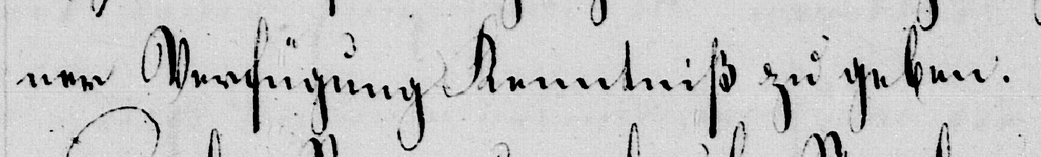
ner Verfügung Kenntniß zu geben.
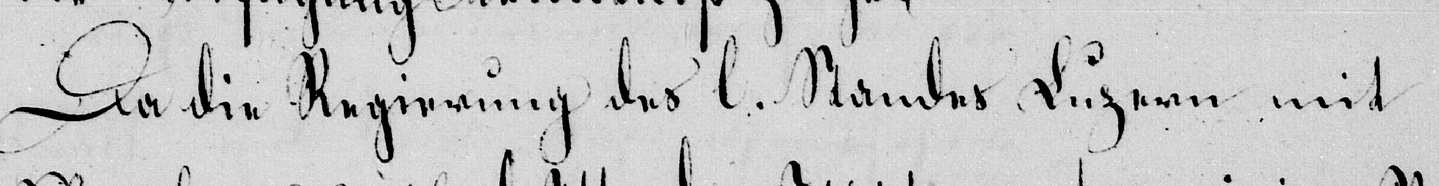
Da die Regierung des L. Standes Luzern mit
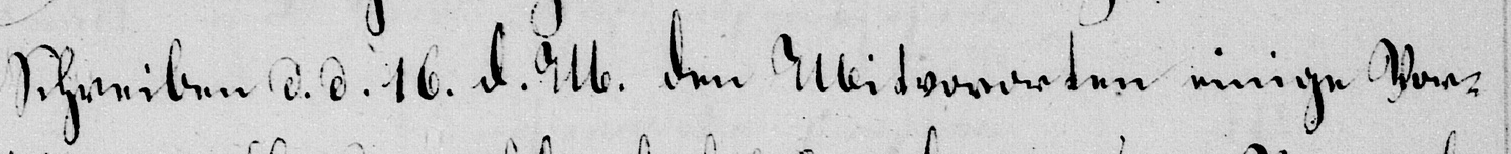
Schreiben d. d. 16. d. M. den Mitvororten einige Vor¬
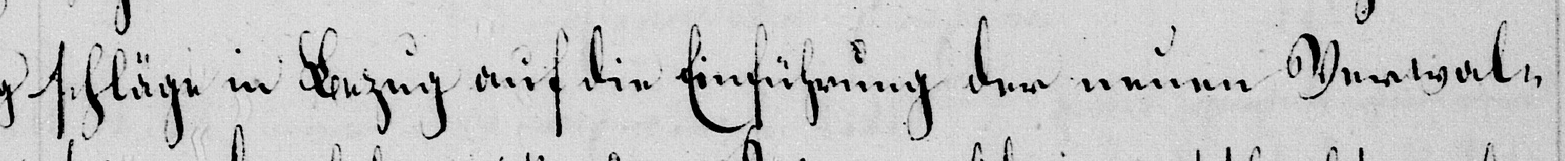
schläge in Bezug auf die Einführung der neuen Verwal¬
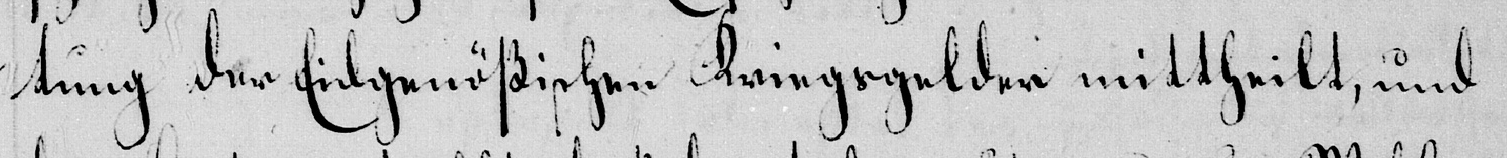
tung der Eidgenößischen Kriegsgelder mittheilt, und
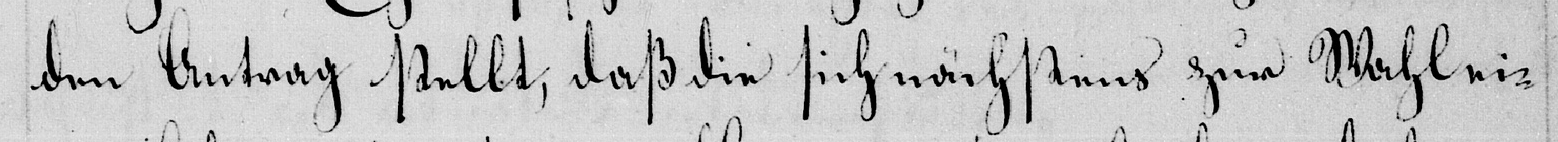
den Antrag stellt, daß die sich nächstens zur Wahl ei¬
